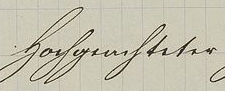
Hochgeachteter
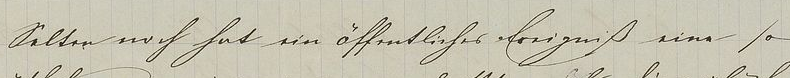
Selten noch hat ein öffentliches Ereigniß eine so
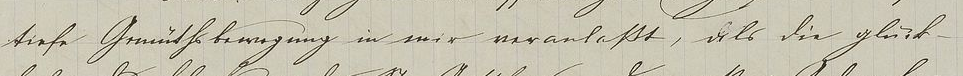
tiefe Gemüthsbewegung in mir veranlaßt, als die glück-
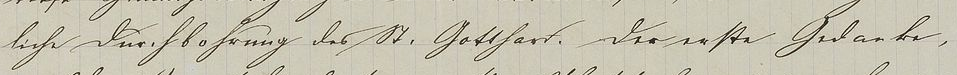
liche Durchbohrung des St. Gotthart. Der erste Gedanke,
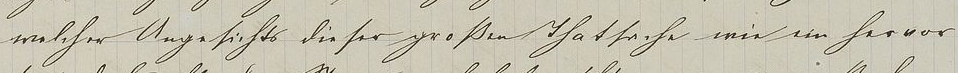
welcher Angesichts dieser großen Thatsache wie ein hervor-
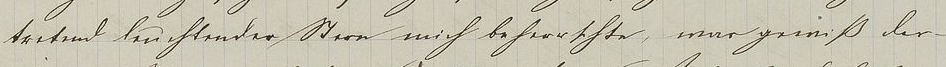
tretend leuchtender Stern mich beherrschte, war gewiß der-
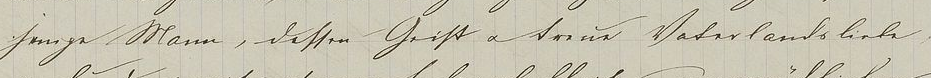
jenige Mann, dessen Geist & treue Vaterlandsliebe
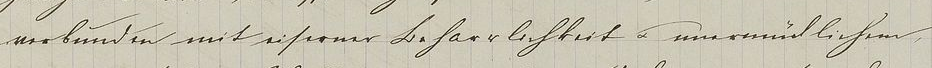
verbunden mit eiserner Beharrlichkeit & unermüdlichem,
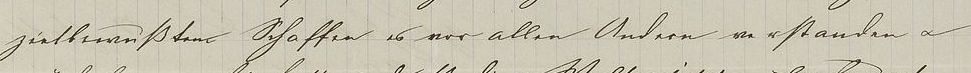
zielbewußtem Schaffen es vor allen Andern verstanden &
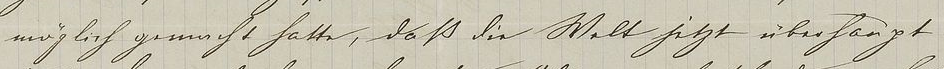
möglich gemacht hatte, daß die Welt jetzt überhaupt
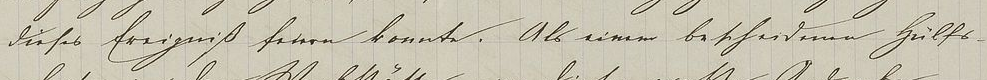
dieses Ereigniß feiern konnte. Als einem bescheidenen Hülfs-
